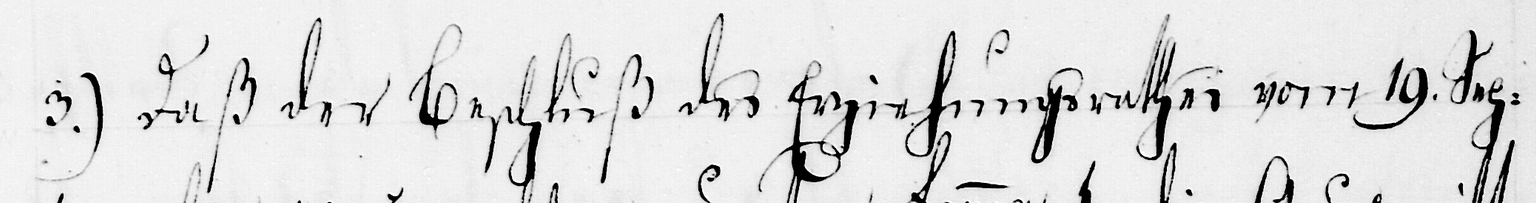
3.) Daß der Beschluß des Erziehungsrathes vom 19. Se¬
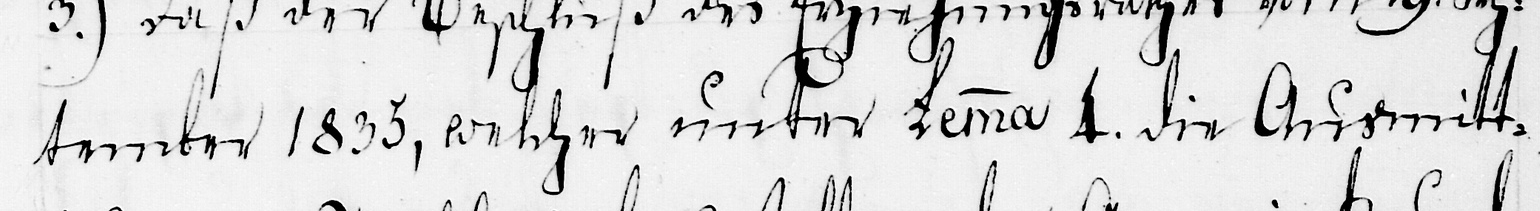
ptember 1835, welcher unter Lemma 4. die Ausmitt¬
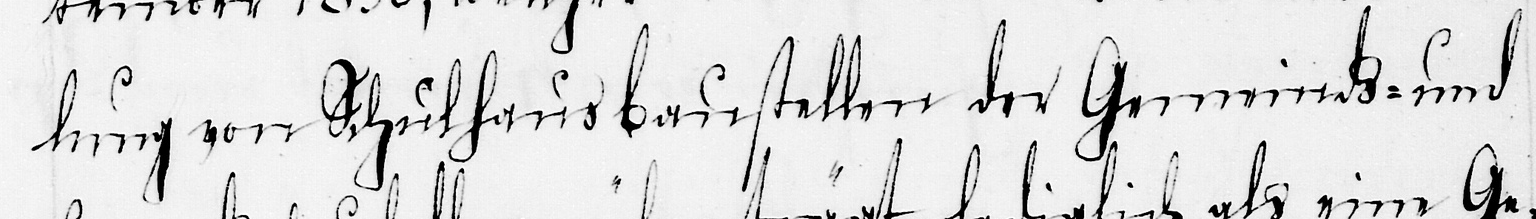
lung von Schulhausbaustellen der Gemeinds- und
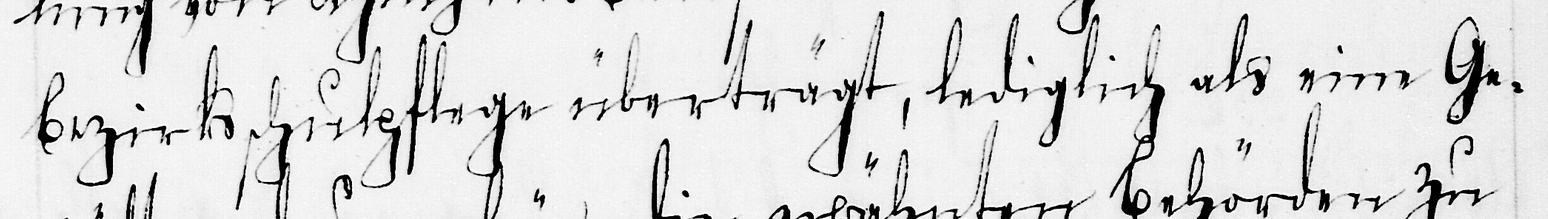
Bezirksschulpflege überträgt, lediglich als eine Ge¬
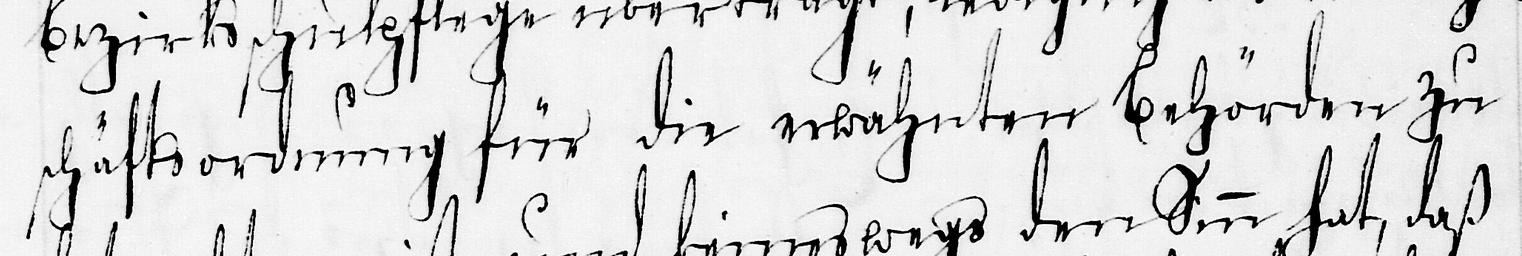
schäftsordnung für die erwähnten Behörden zu
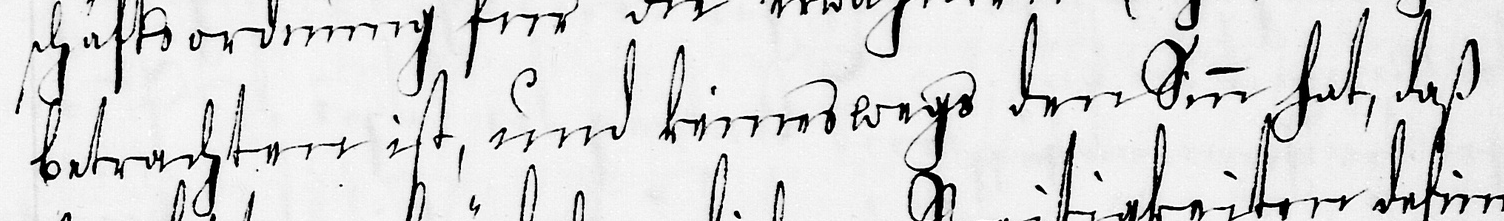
betrachten ist, und keineswegs den Sinn hat, daß
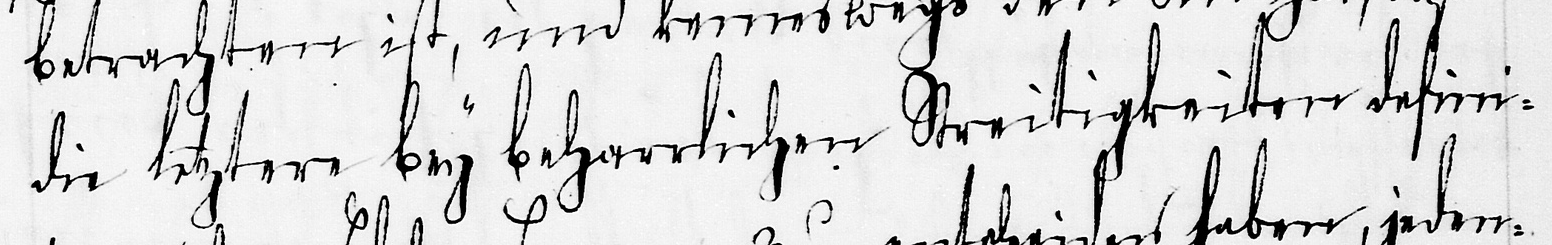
die letztere bey beharrlichen Streitigkeiten defini¬
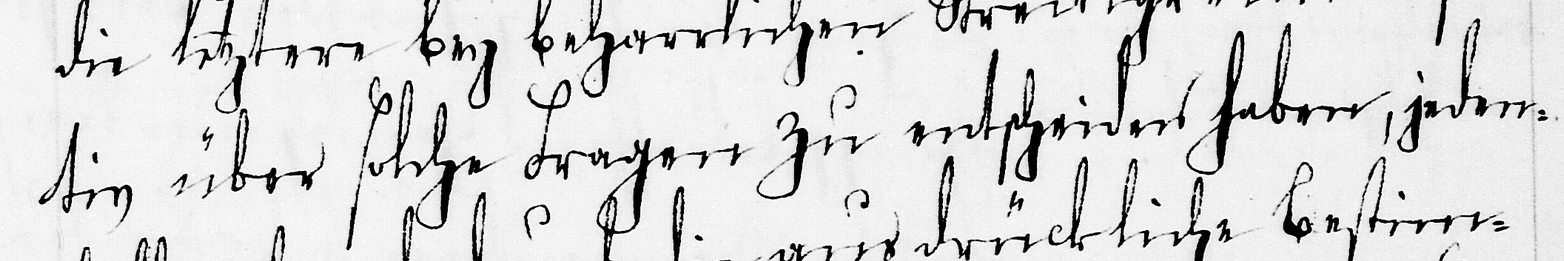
tiv über solche Fragen zu entscheiden haben, jeden¬
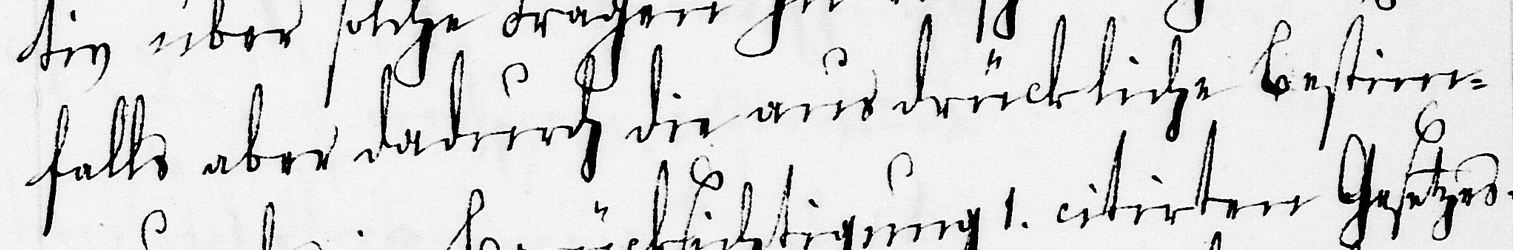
falls aber dadurch die ausdrückliche Bestim¬
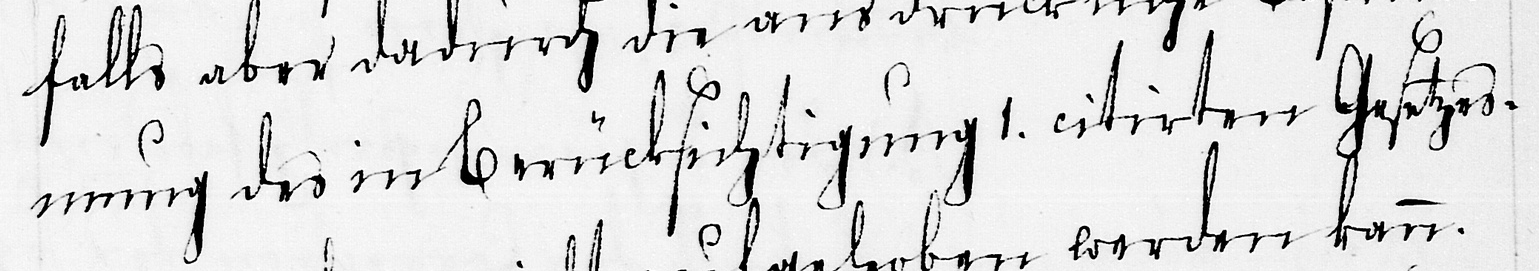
mung des in Berücksichtigung 1. citirten Gesetzes¬
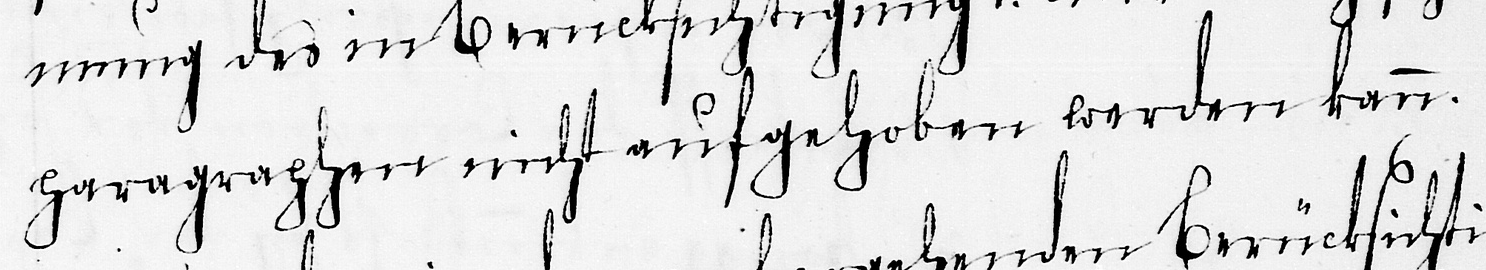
paragraphen nicht aufgehoben werden kann.
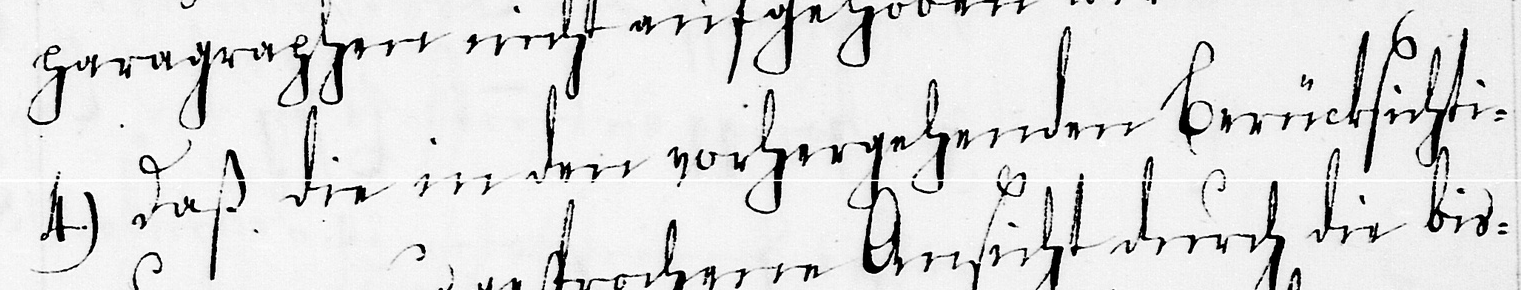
4.) Daß die in den vorhergehenden Berücksichti¬
